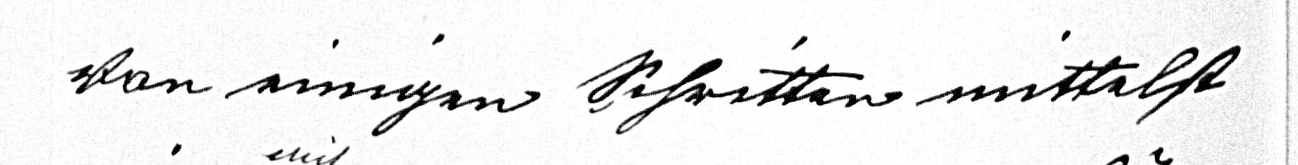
von einigen Schritten mittelst
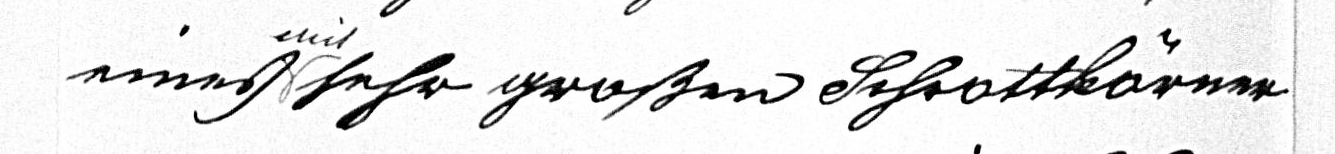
eines mit sehr großen Schrottkörner
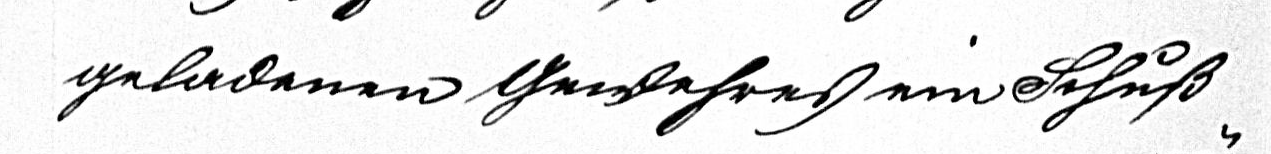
geladenen Gewehres ein Schuß
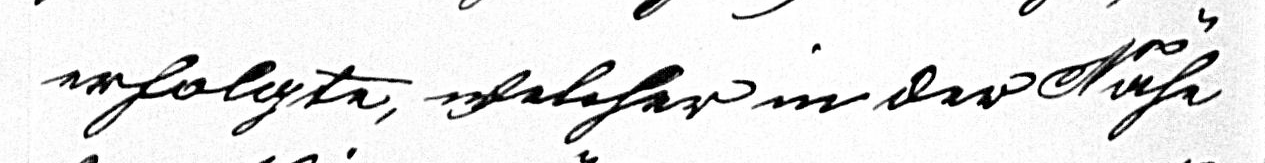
erfolgte, welcher in der Nähe
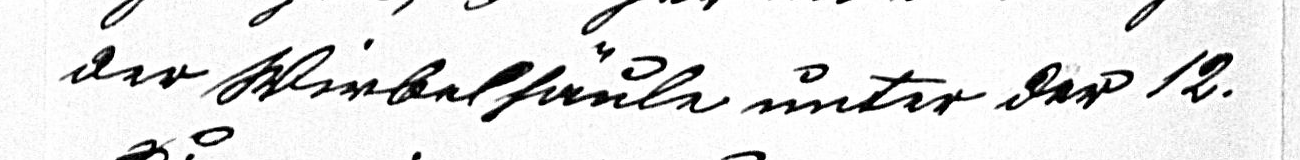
der Wirbelsäule unter der 12.
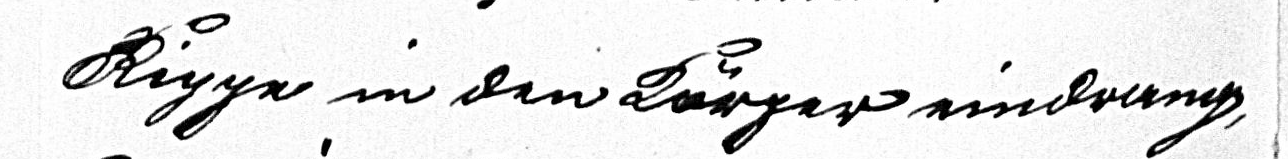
Rippe in den Körper eindrang,
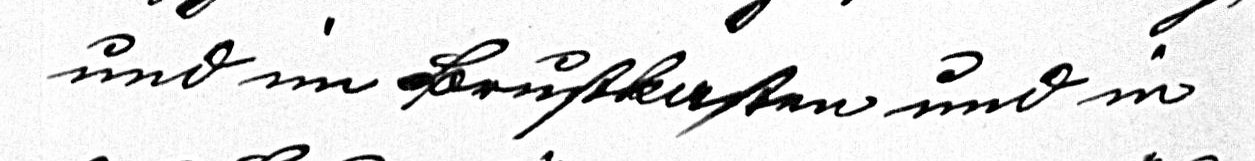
und im Brustkasten und in
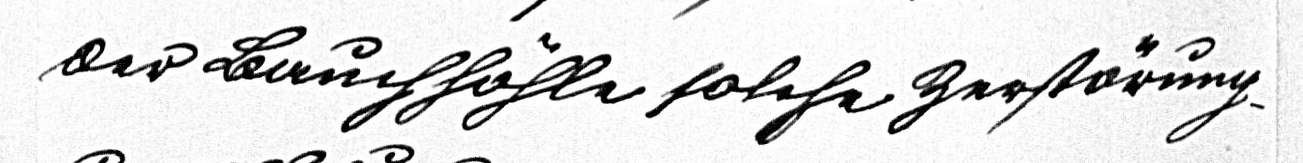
der Bauchhöhle solche Zerstörung
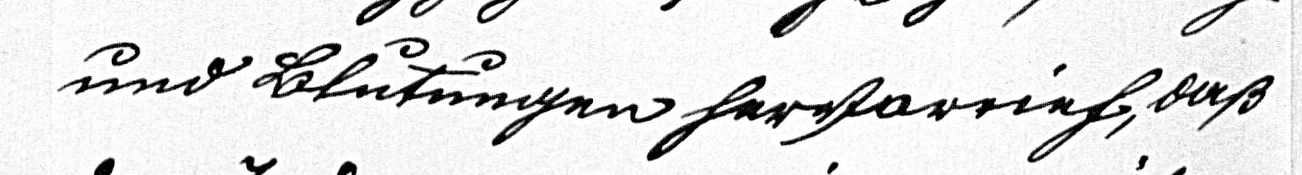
und Blutungen hersoreief, daß
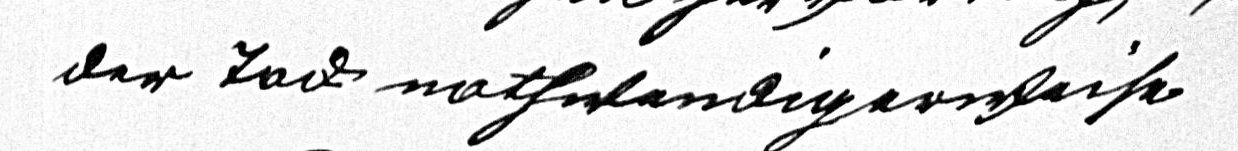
der Tod nothwendigerweise
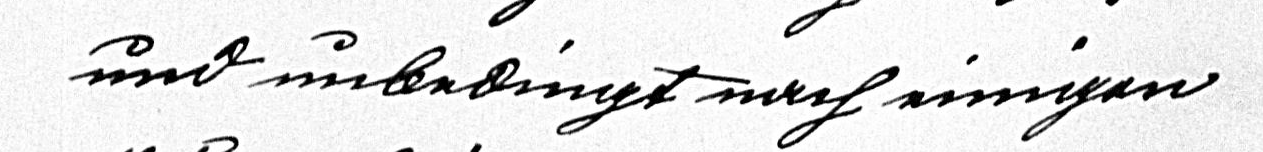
und unbedingt nach einigen
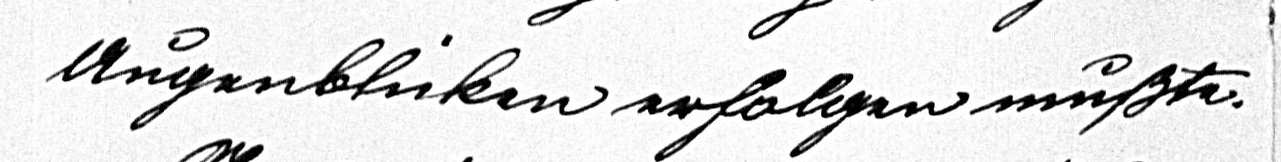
Augenblicken erfolgen mußte.
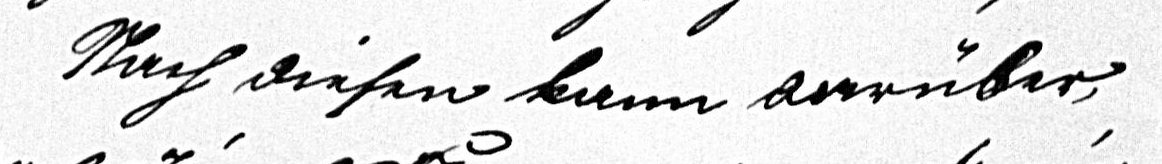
Nach diesen kann darüber,
